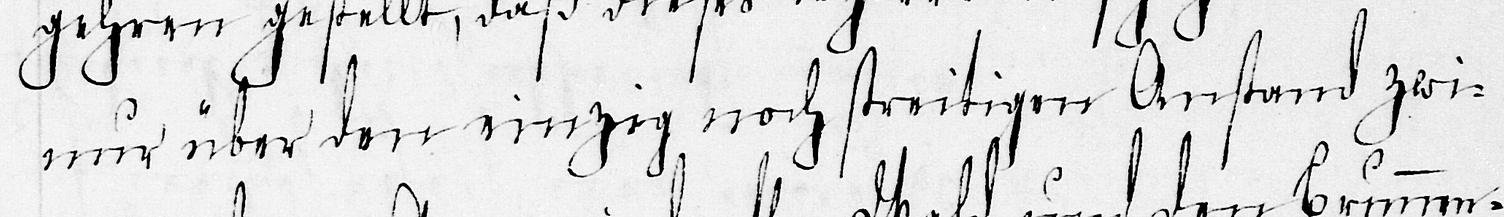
nur über den einzig noch streitigen Anstand zwi¬
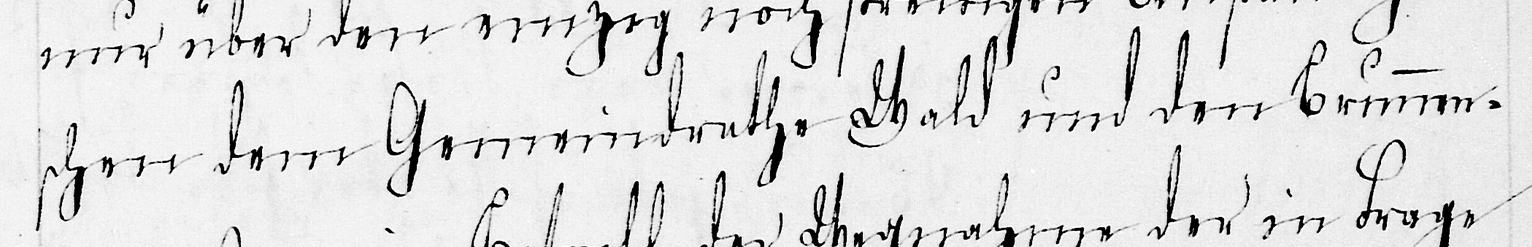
schen dem Gemeindrathe Wald und den Brunnen¬
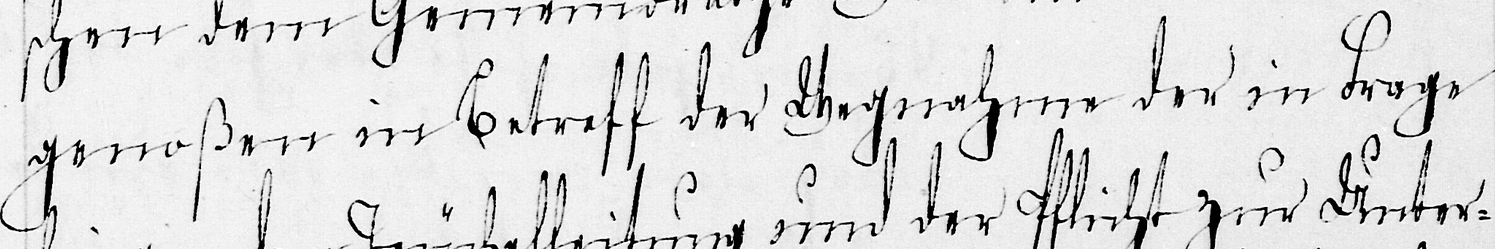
genoßen in Betreff der Wegnahme der in Frage
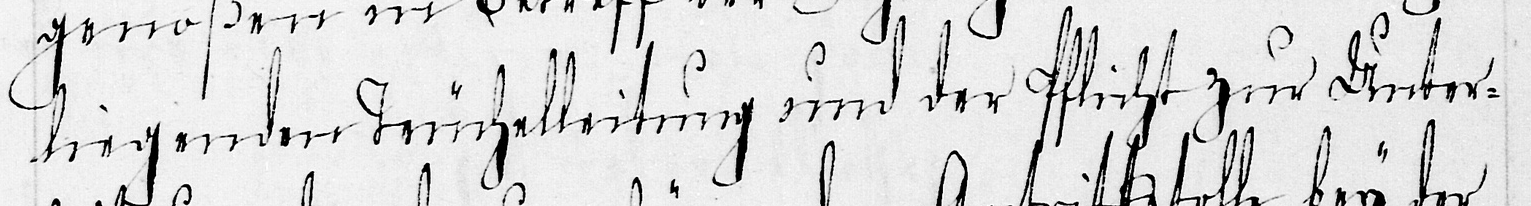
liegenden Teuchelleitung und der Pflicht zur Unter¬
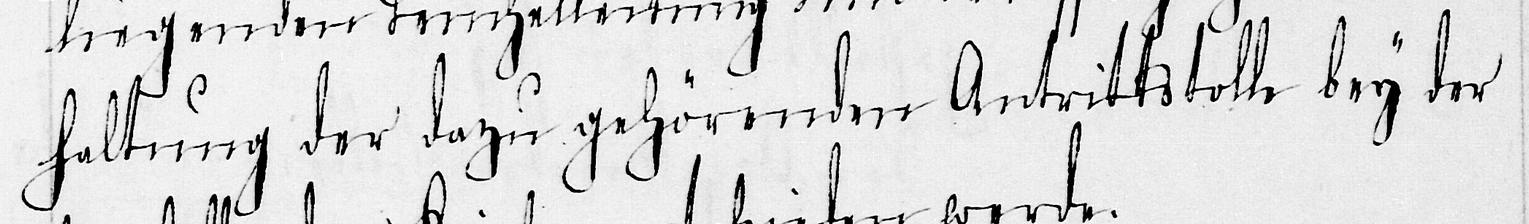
haltung der dazu gehörenden Antrittstolle bey der
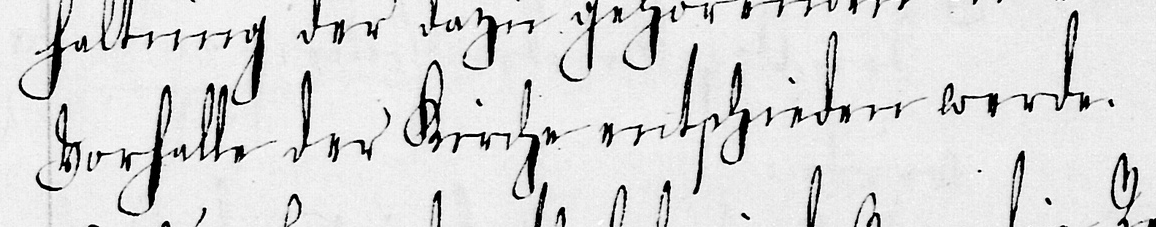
Vorhalle der Kirche entschieden werde.
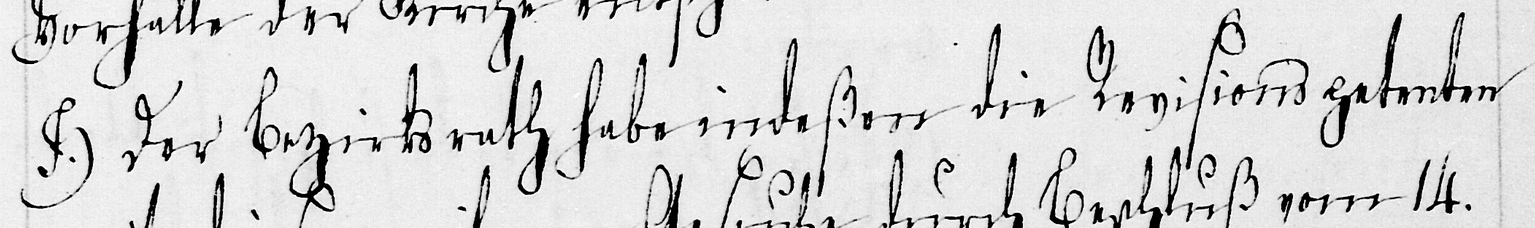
F.) Der Bezirksrath habe indeßen die Revisionspetenten
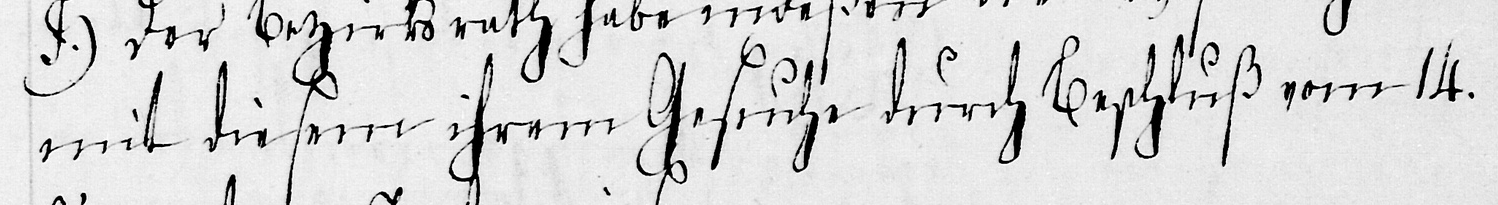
mit diesem ihrem Gesuche durch Beschluß vom 14.
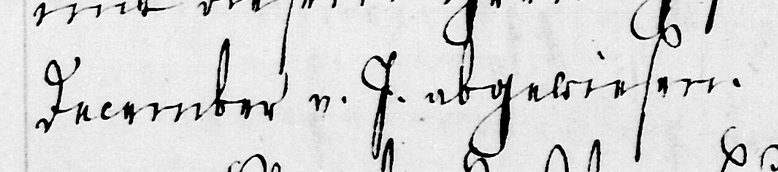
December v. J. abgewiesen.
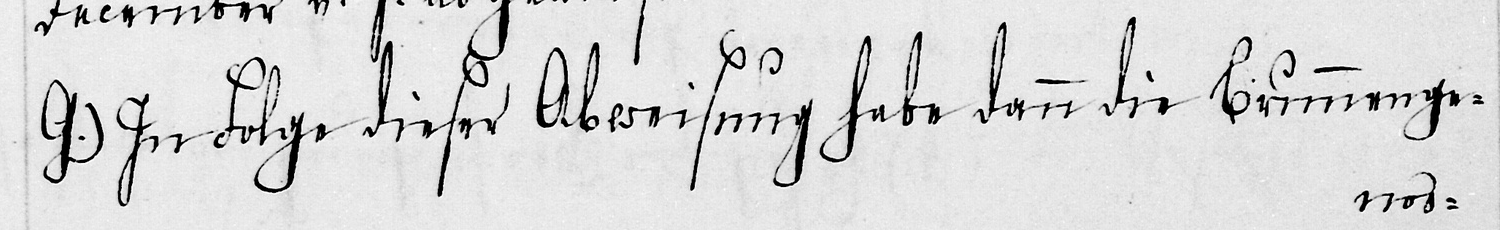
G.) In Folge dieser Abweisung habe dann die Brunnenge-
